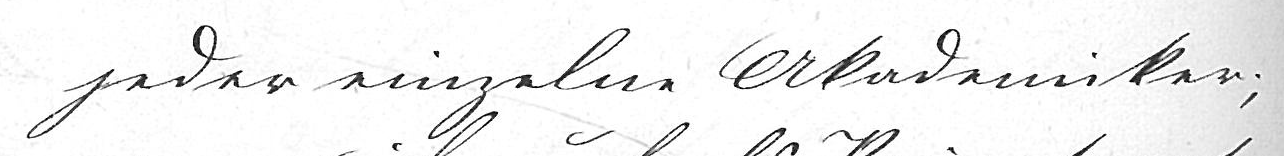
jeder einzelne Akademiker;
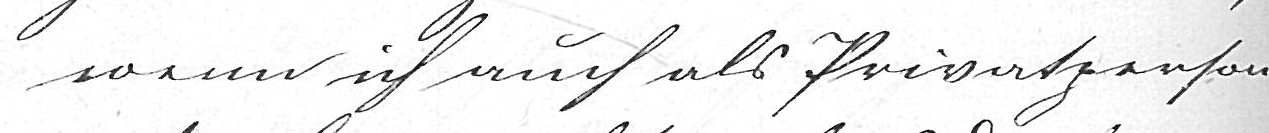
wenn ich auch als Privatperson
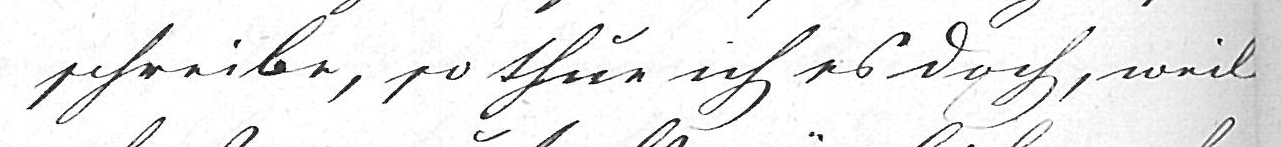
schreibe, so thue ich es doch, weil
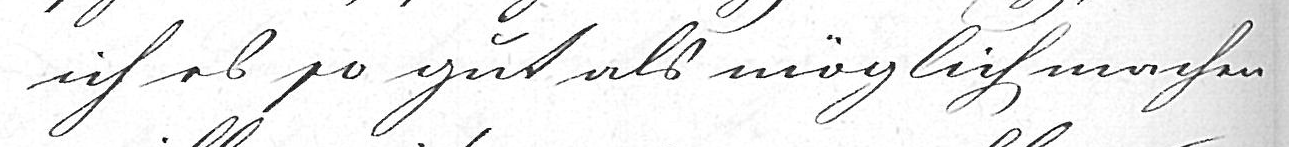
ich es so gut als möglich machen
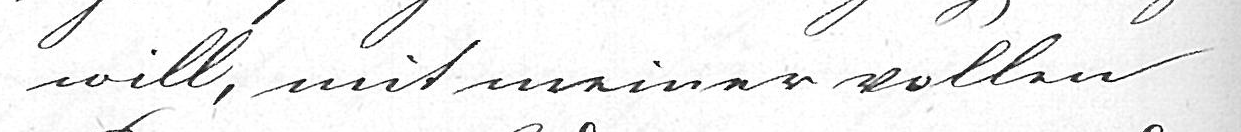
will, mit meiner vollen
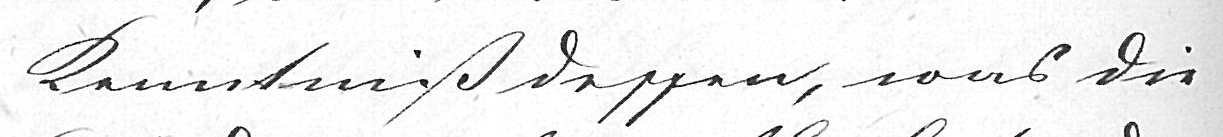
Kenntniß dessen, was die
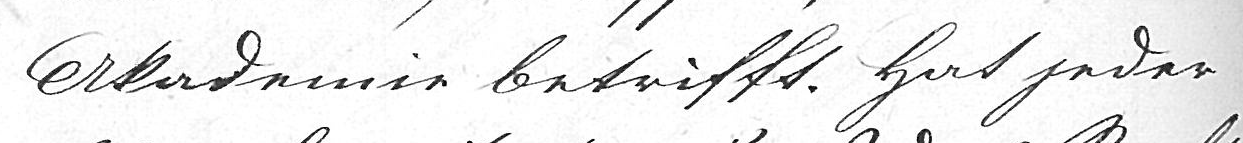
Akademie betrifft. Hat jeder
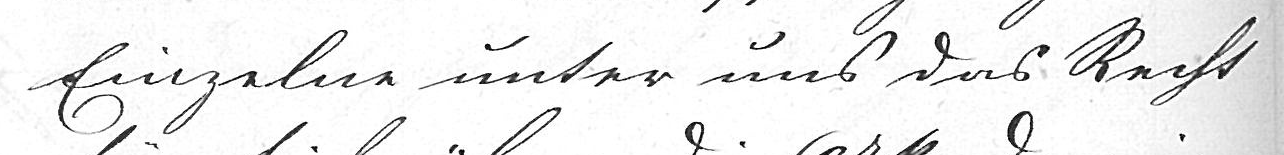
Einzelne unter uns das Recht
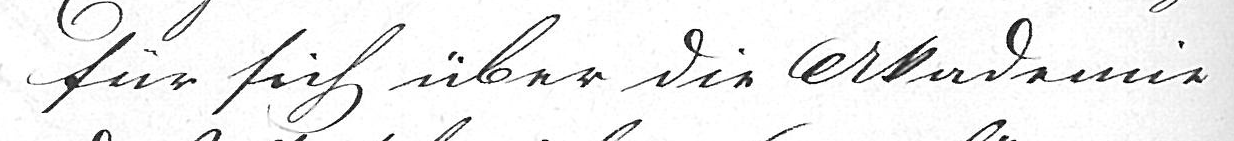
für sich über die Akademie
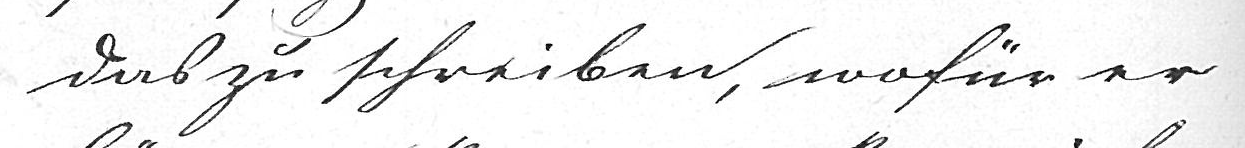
das zu schreiben, wofür er
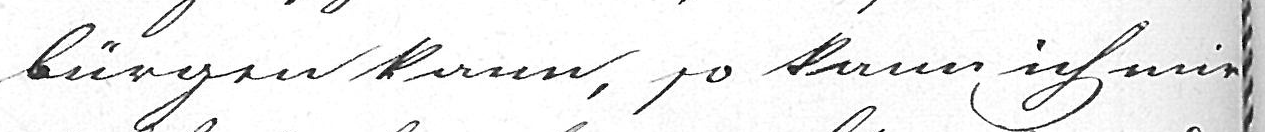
bürgen kann, so kann ich mir
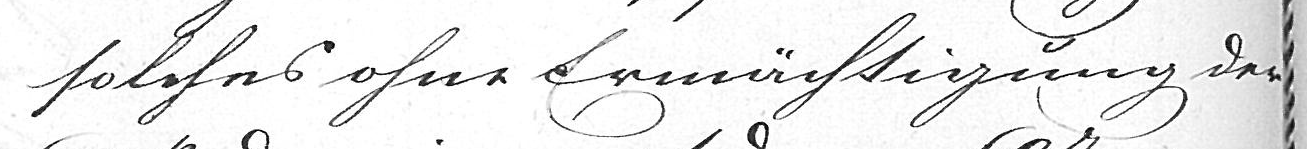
solches ohne Ermächtigung der
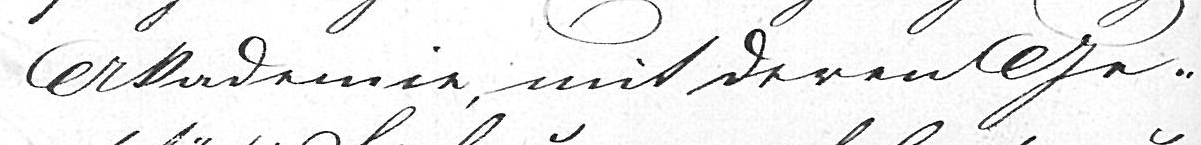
Akademie, mit deren Ge-
